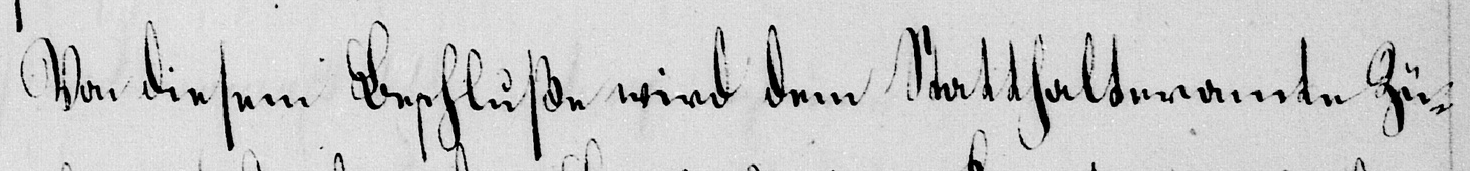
Von diesem Beschluße wird dem Statthalteramt Zü¬
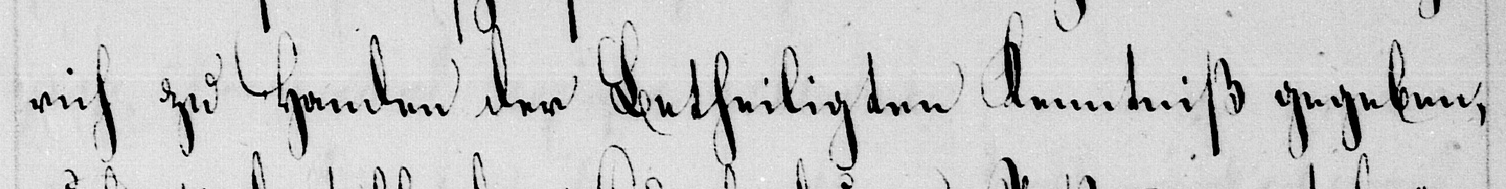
rich zu Handen der Betheiligten Kenntniß gegeben,
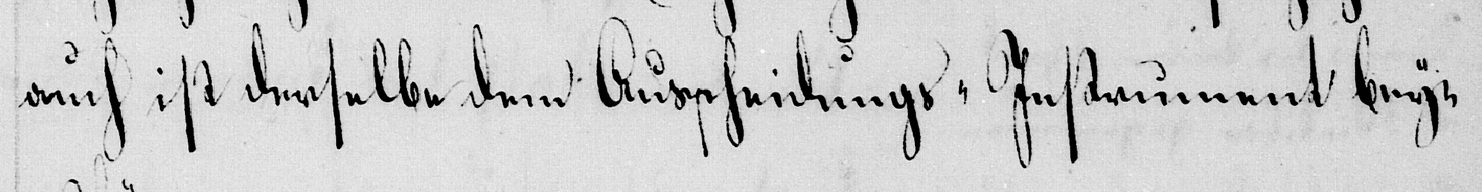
auch ist derselbe dem Ausscheidungs-Instrument bey¬
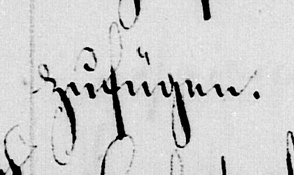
zufügen.
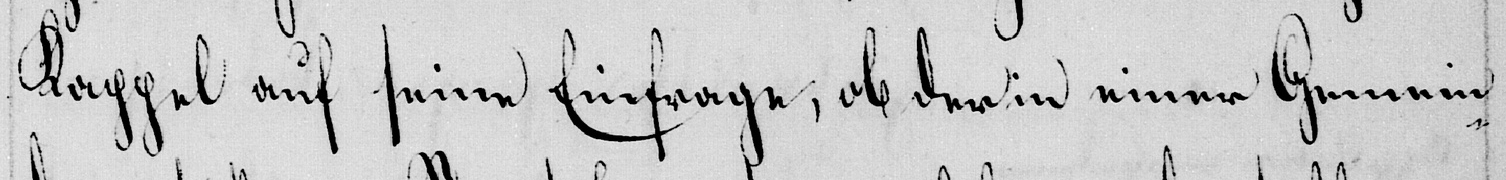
Kappel auf seine Einfrage, ob der in einer Gemein¬
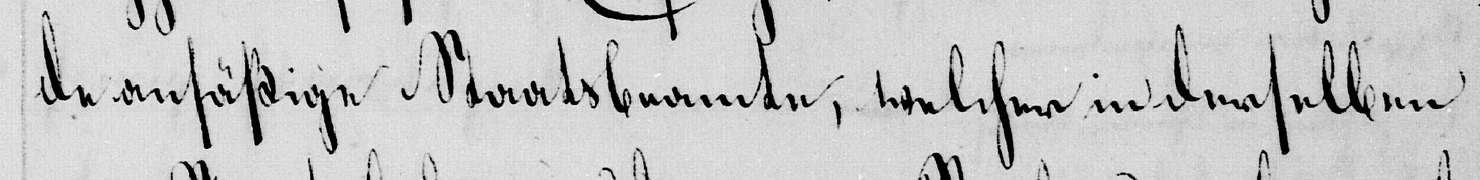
de ansäßige Staatsbeamte, welcher in derselben
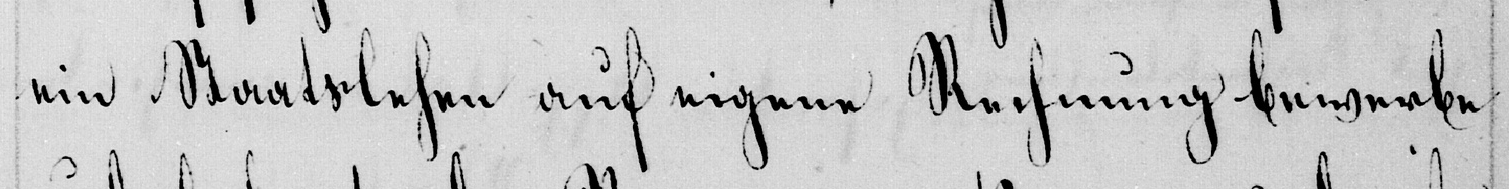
ein Staatslehen auf eigene Rechnung bewerbe
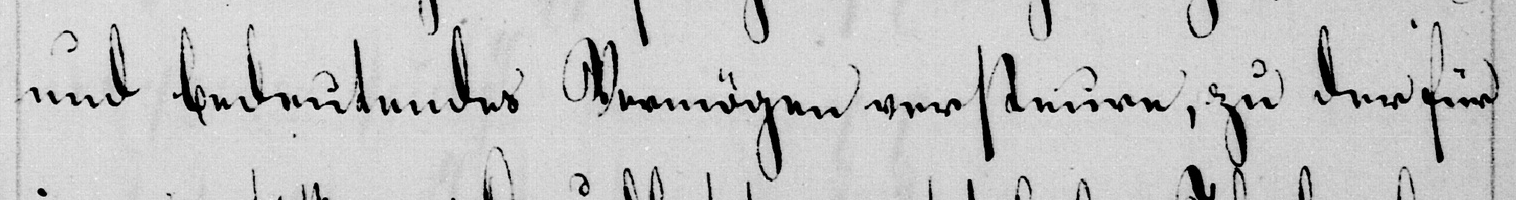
und bedeutendes Vermögen versteure, zu der für
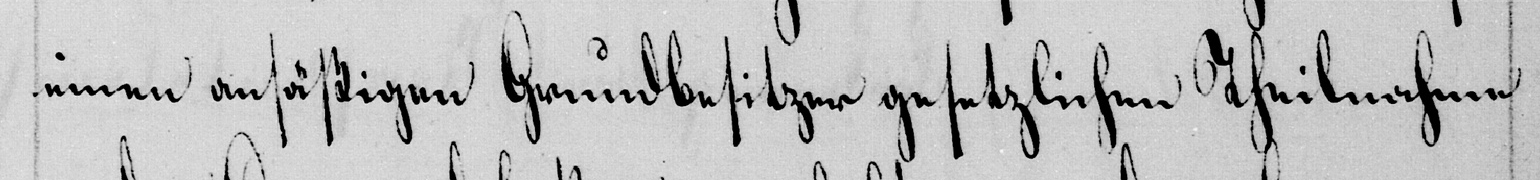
einen ansäßigen Grundbesitzer gesetzlichen Theilnahme
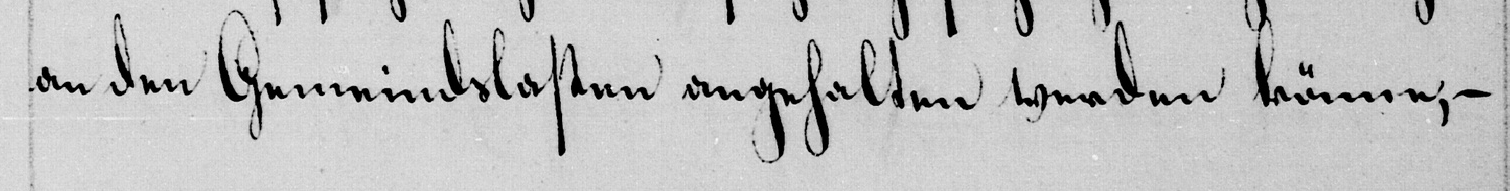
an den Gemeindslasten angehalten werden könne; –
